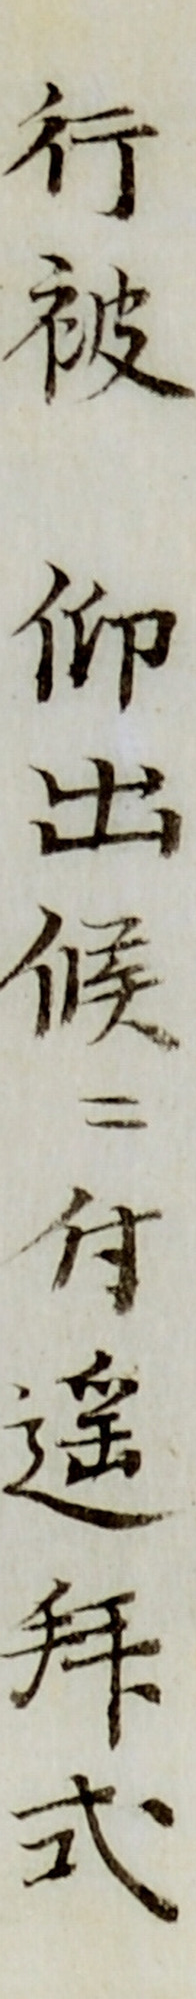行被仰出候に付遥拝式
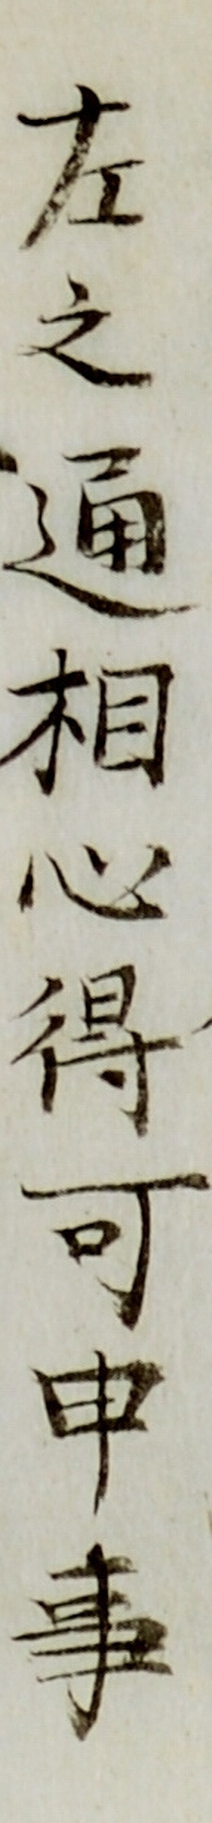左之通相心得可申事

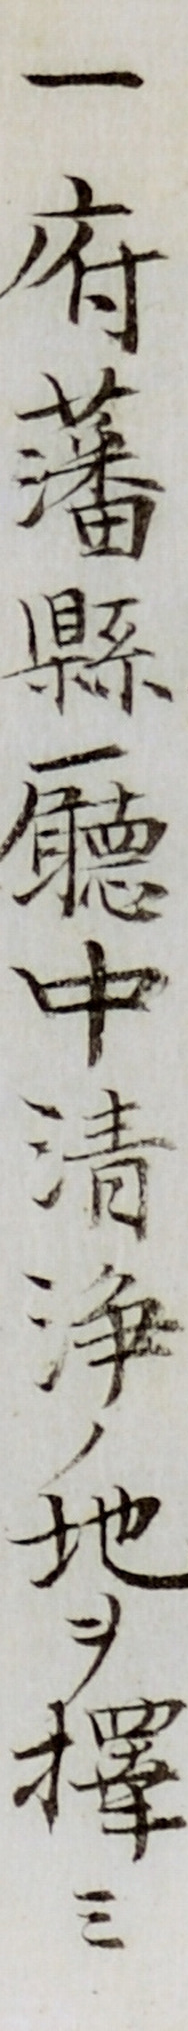一府藩県庁中清浄ノ地ヲ択ミ
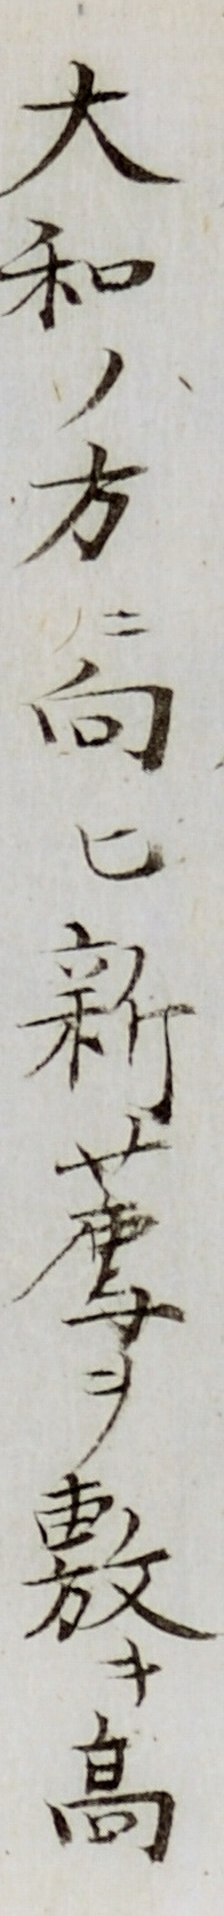大和ノ方ニ向ヒ新薦ヲ敷キ高
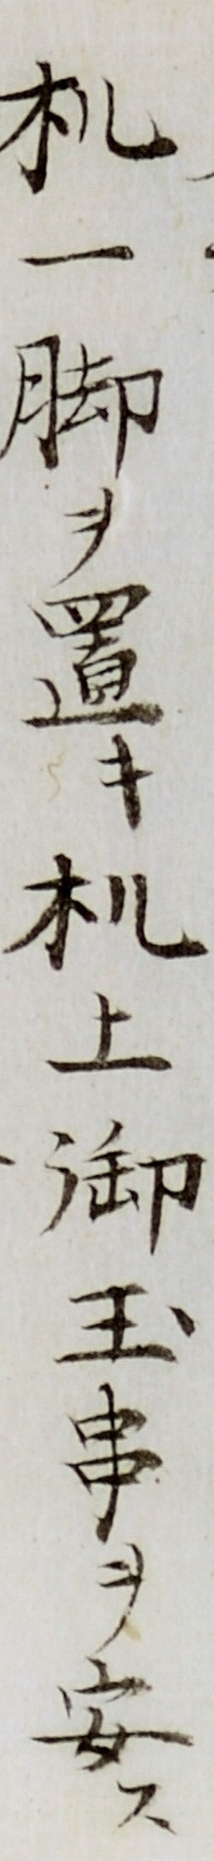机一脚ヲ置キ机上御玉串ヲ安ス
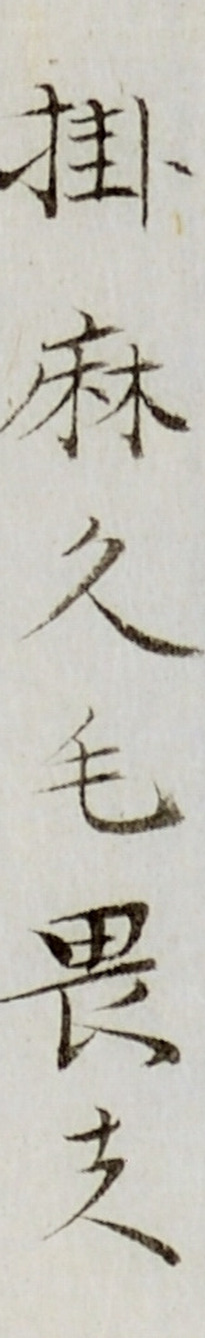掛麻久毛畏支
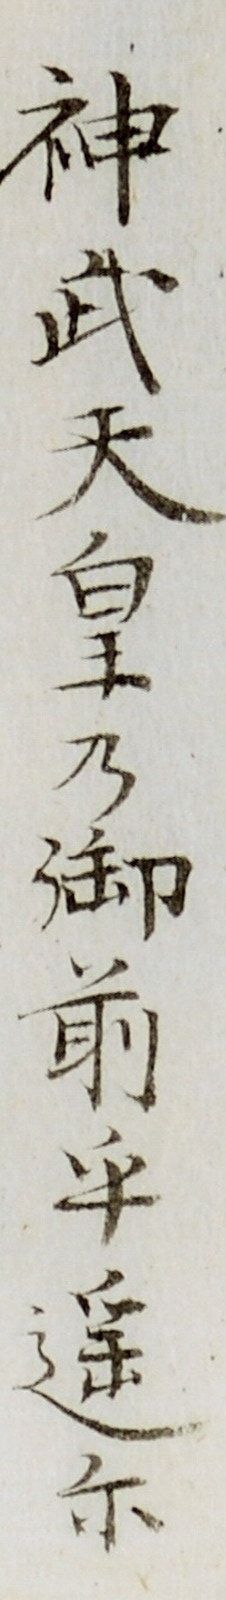神武天皇乃御前乎遥尓
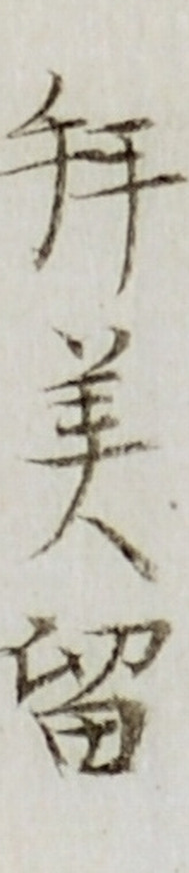拝美留
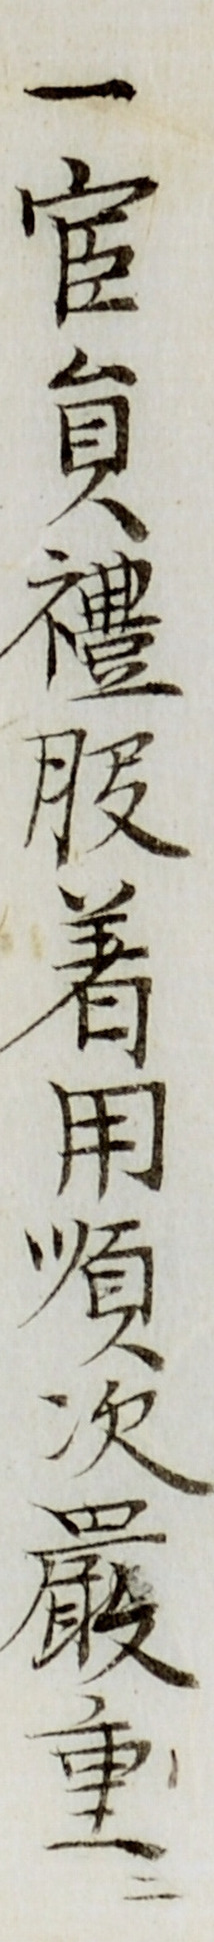一官員礼服着用順次厳重ニ
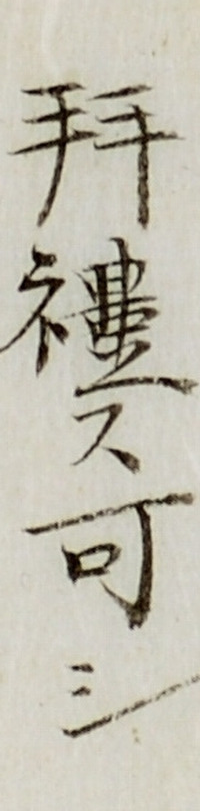拝礼ス可シ
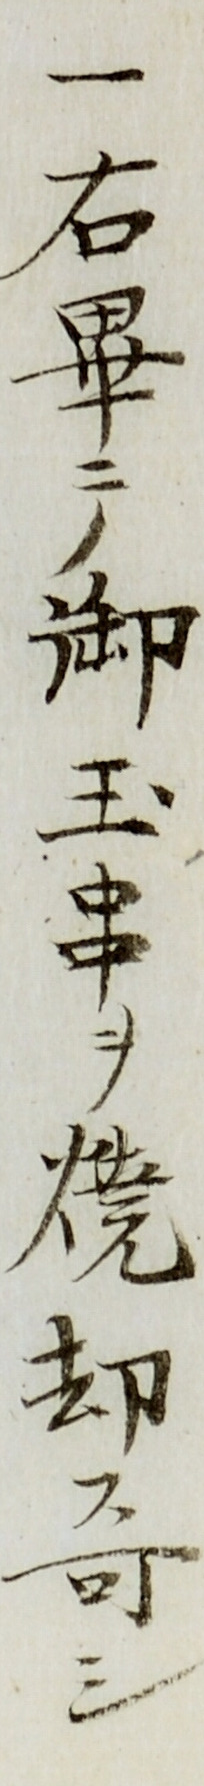一右畢テ御玉串ヲ焼却ス可シ
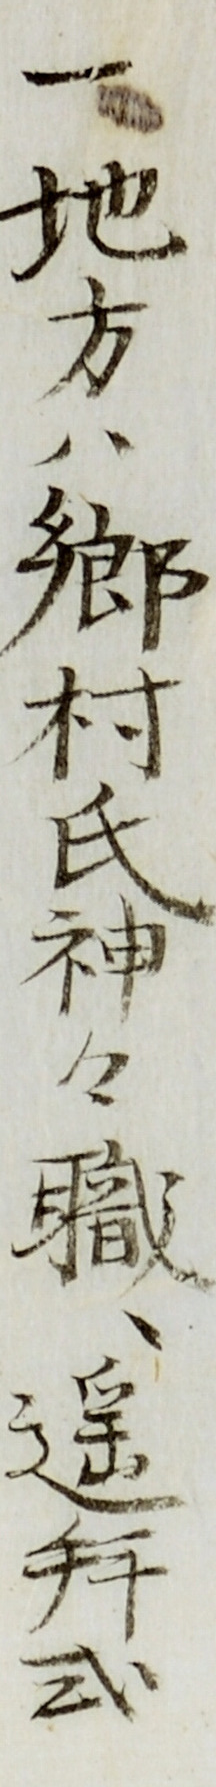一地方ハ郷村氏神々職ヘ遥拝式
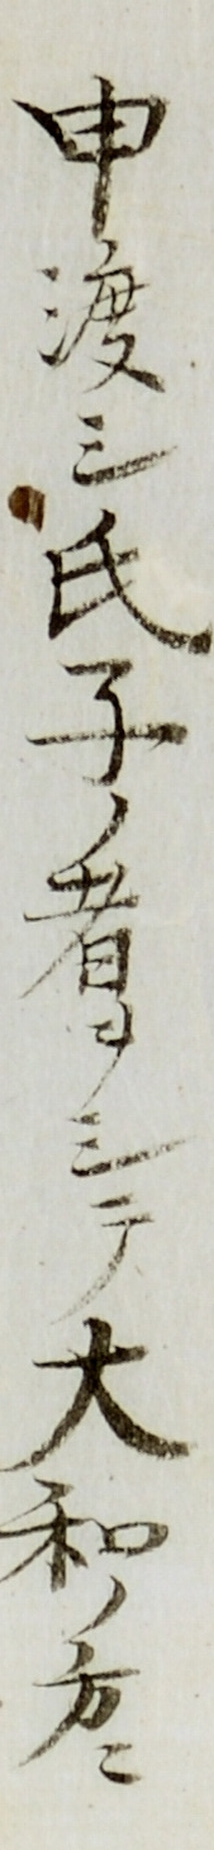申渡シ氏子ノ者ヲシテ大和ノ方ニ
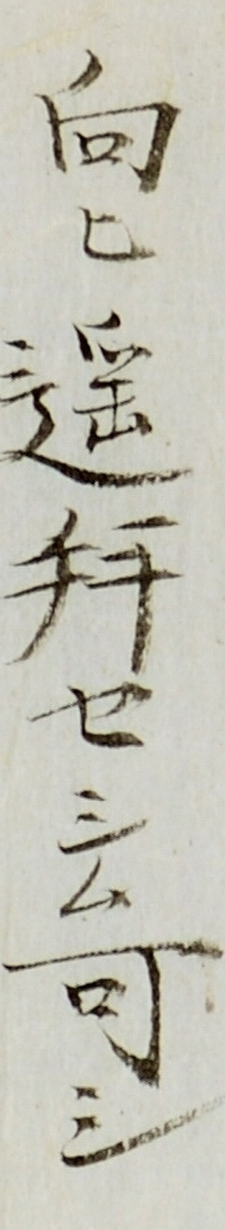向ヒ遥拝セシム可シ
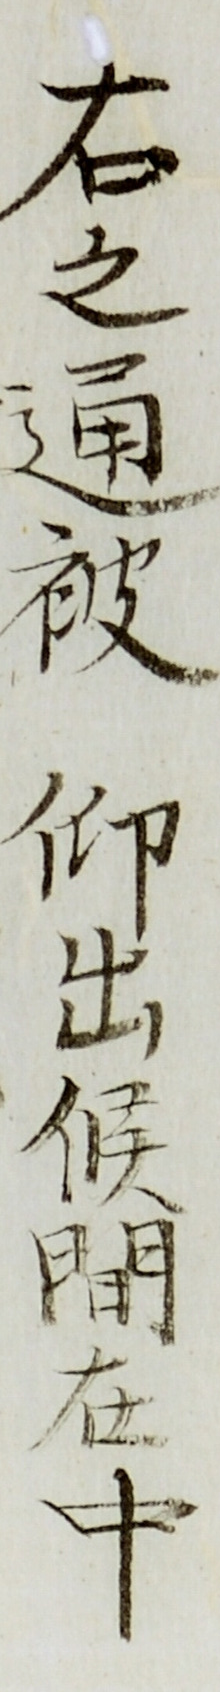右之通被仰出候間在中
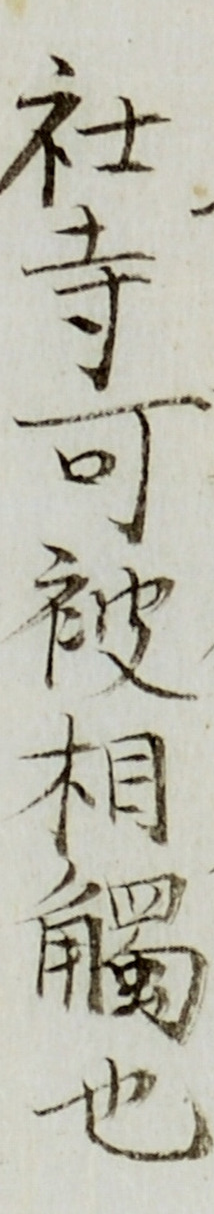社寺可被相触也
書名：山林方諸事御用留
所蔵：伊那市立高遠町図書館・合同会社AMANE
